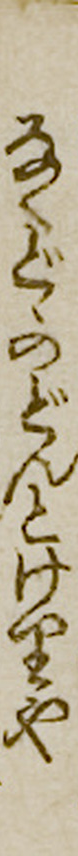なくどゝのどんとけりや
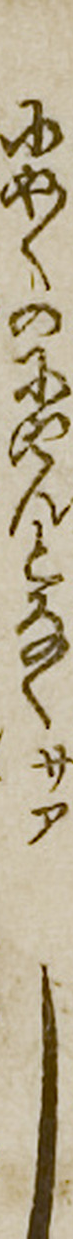にや〳〵のにやんとなくさあ
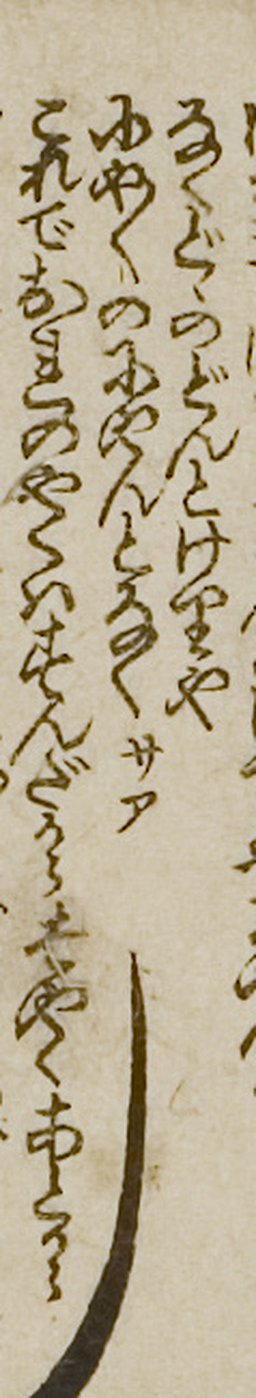にや〳〵のにやんとなくさあ
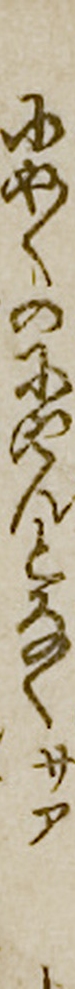にや〳〵のにやんとなくさあ
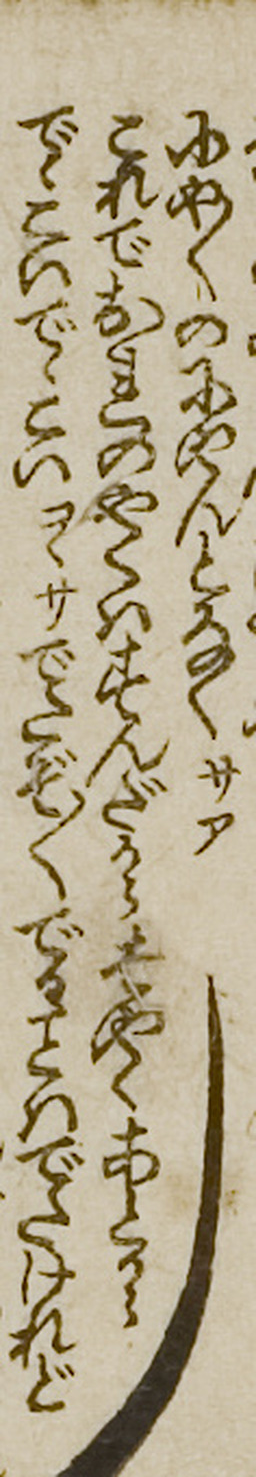これでおれのやくはすんだろうはやくあとから
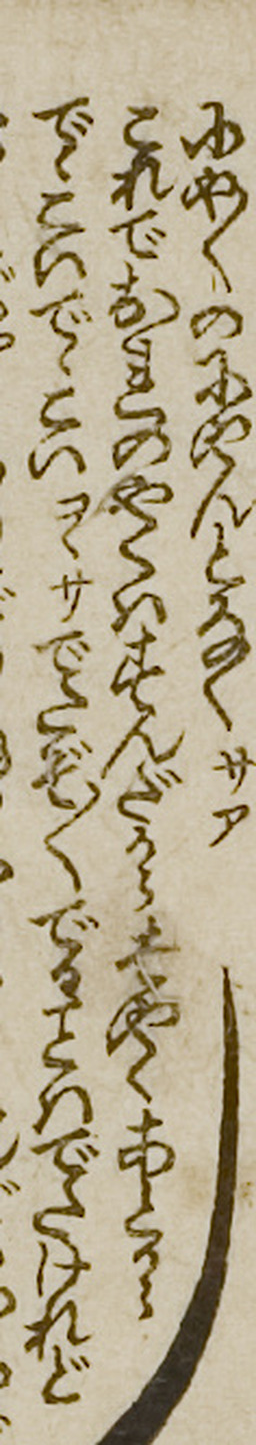これでおれのやくはすんだろうはやくあとから
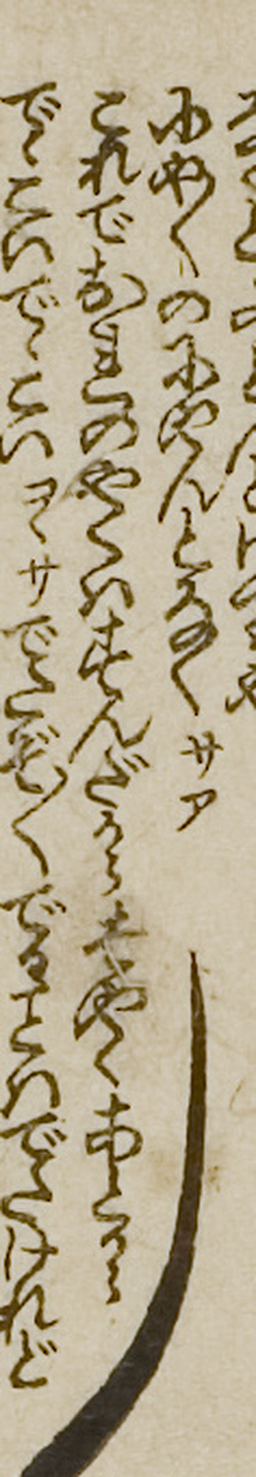これでおれのやくはすんだろうはやくあとから
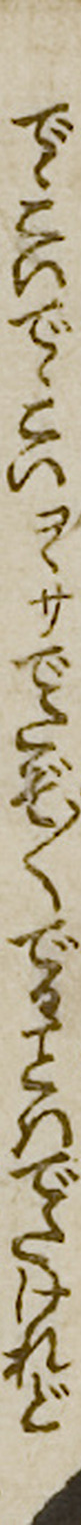でゝこいでゝこいこくさでたぞ〳〵でることいでたけれど
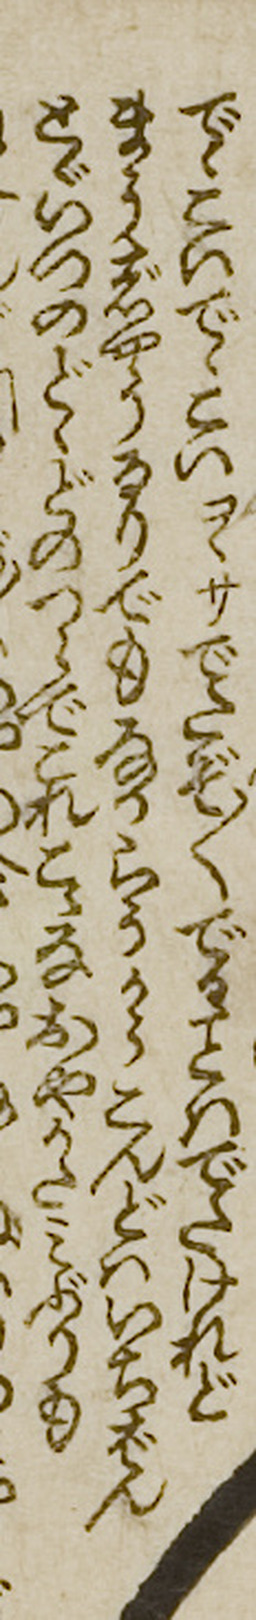まうじやうなりでもなからうからこんどはいちばん
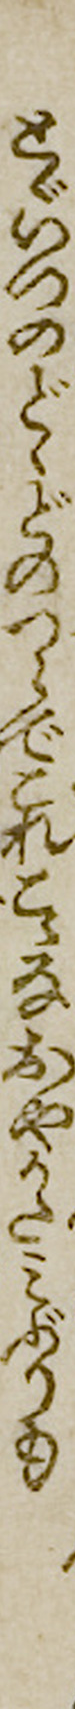とゞいつのどゝどのつらでこれこゝなおやかたみぶりも
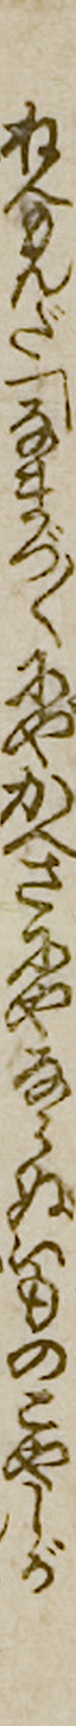ねんねんだ「なまづ〳〵にやかへさにやならぬいものこやしが
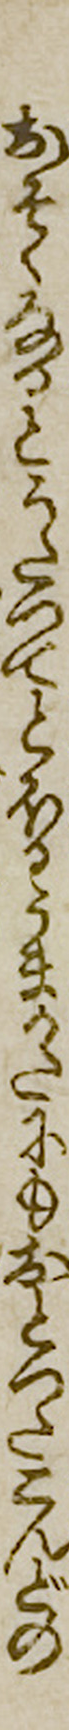おそくなるとうたつてとほるうまかたにもおとつたこんどの
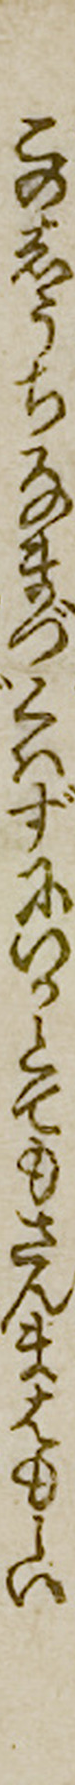このしうちなまづくはずにいかとてもさんまはもらい
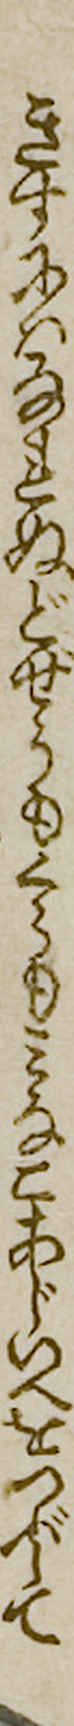きすにはなれぬどぜうもくらもみなこあじいへをつぶして
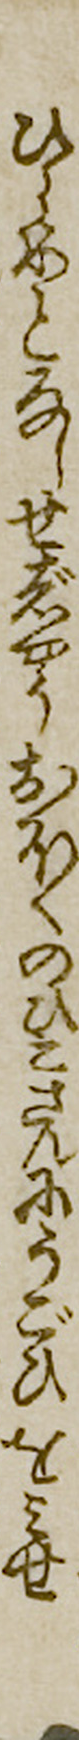ひらめとなしせじやうおほくのひこさんにうごひをみせ
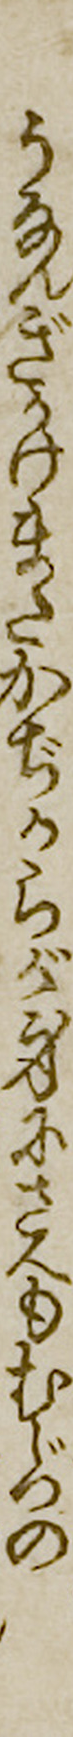うなんぎうけまたかぢからが身にさ人もむじつの
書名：万歳楽鯰の後悔
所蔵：東京大学総合図書館 General Library in the University of Tokyo, JAPAN
